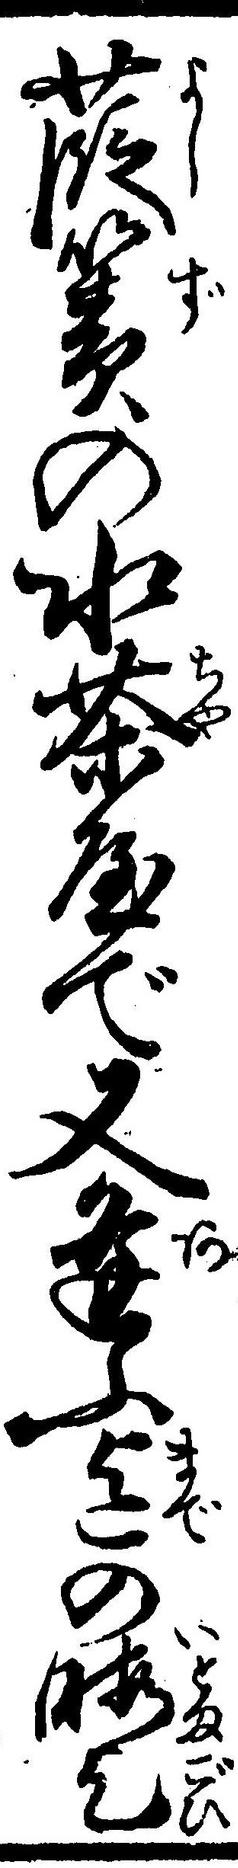葭簀の水茶屋で又逢ふ迄の暇乞
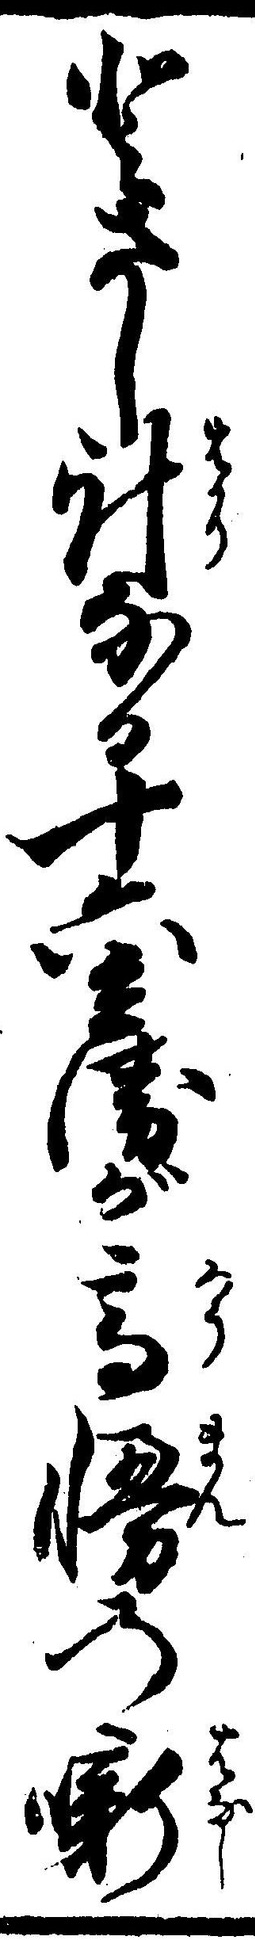とさし計なる十六兵衛が高慢の噺
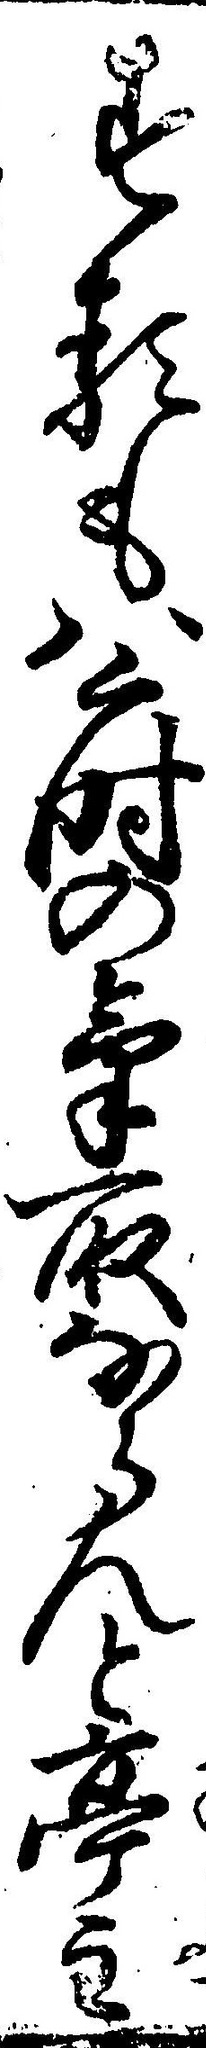するも公時の気取ならんと亭主
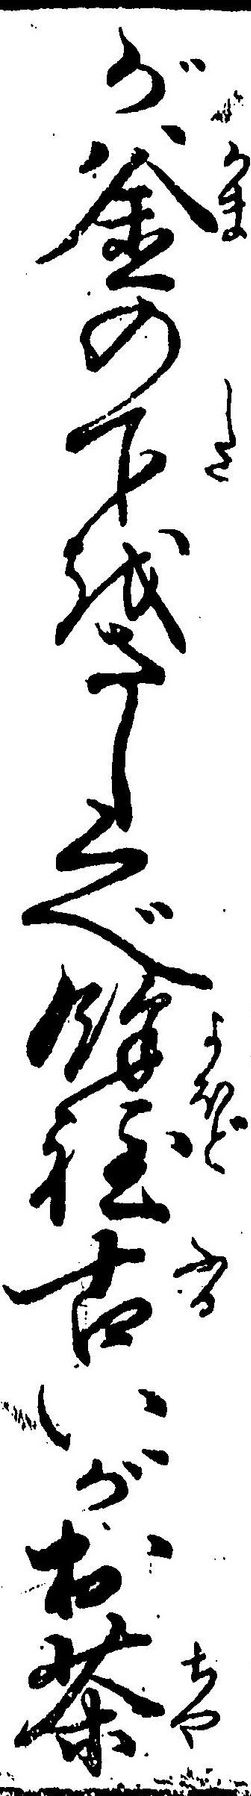が釜の下をさしくべ余程古いがお茶
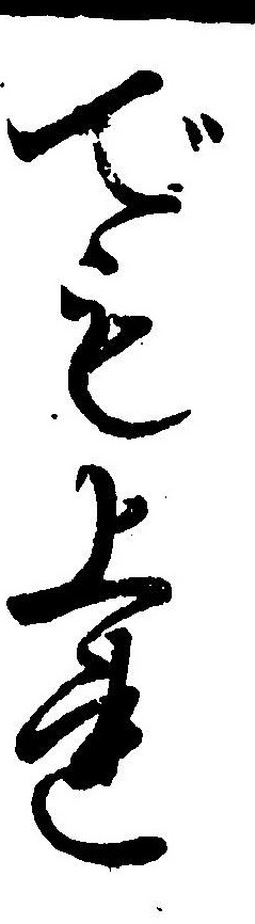でも上れ
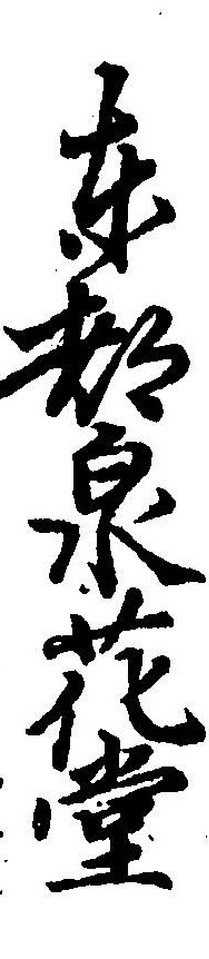東都泉花堂
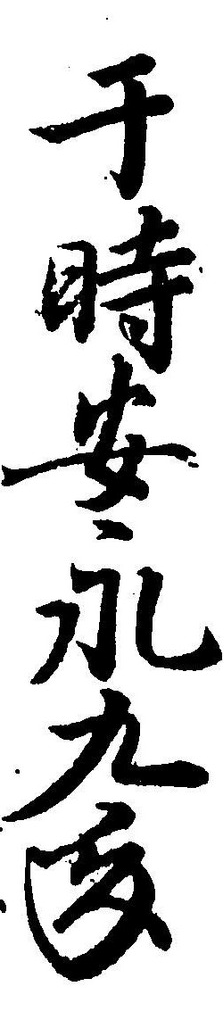于時安永九年
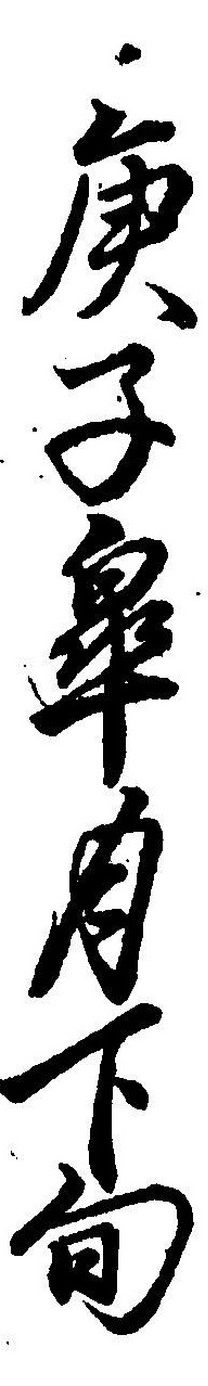庚子皐月下旬
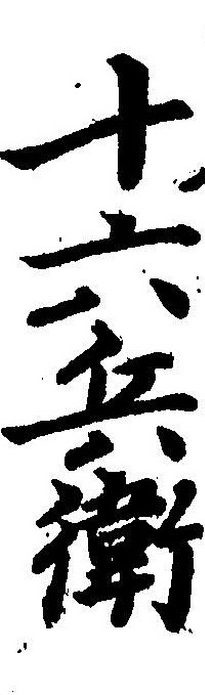十六兵衛

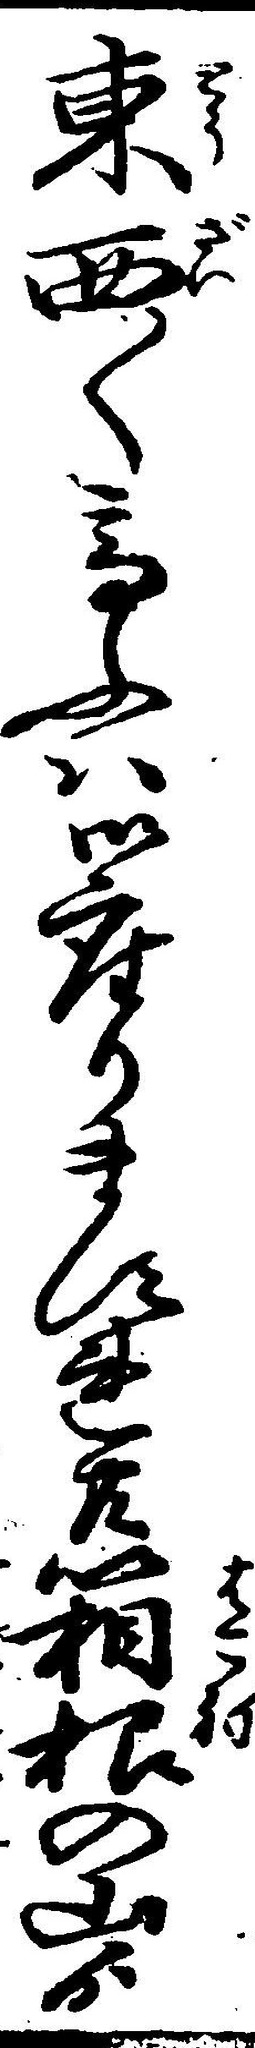東西〳〵高ふは御座りますれ共箱根の山ゟ
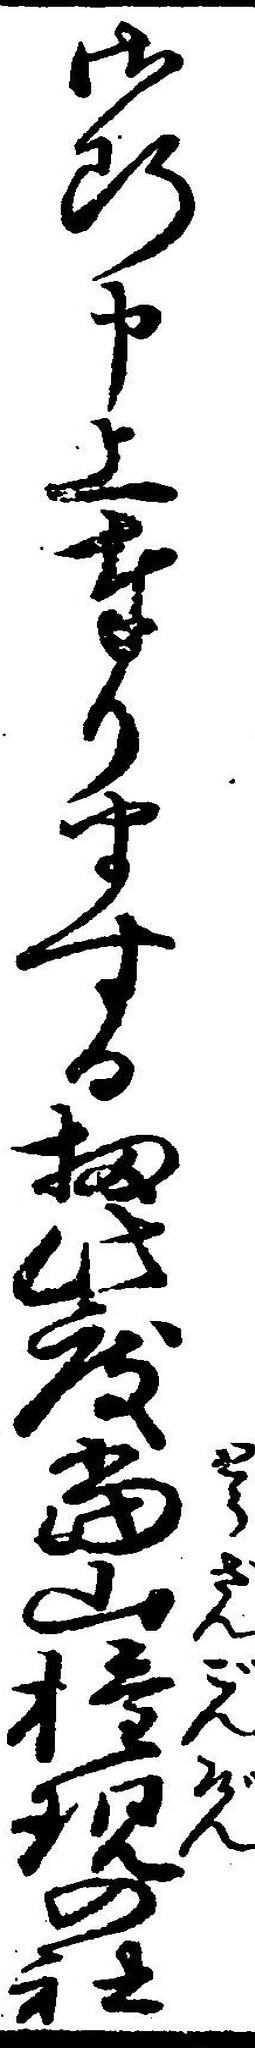御断申上なりまする扨此度当山権現の社
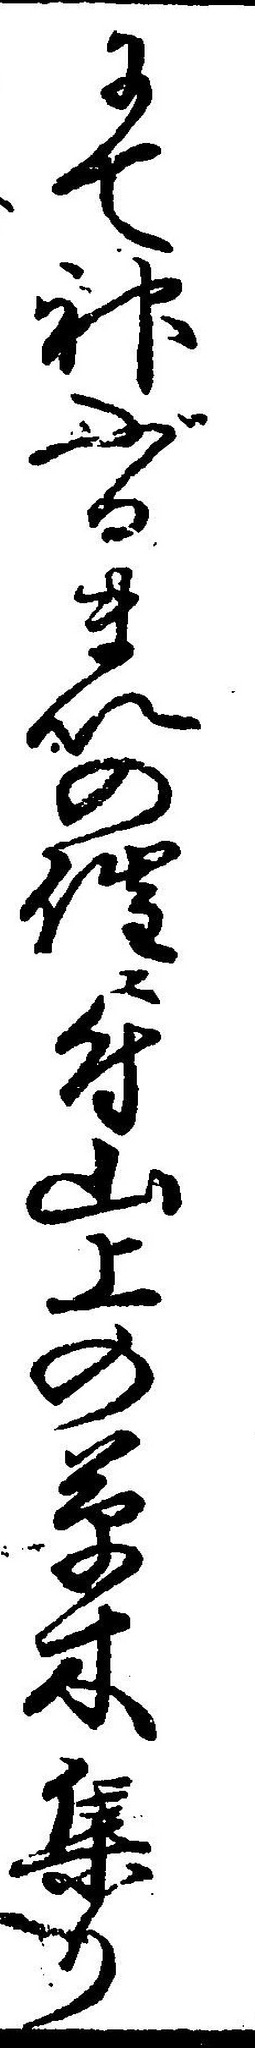にて神ぶるまいの催付山上の草木集り
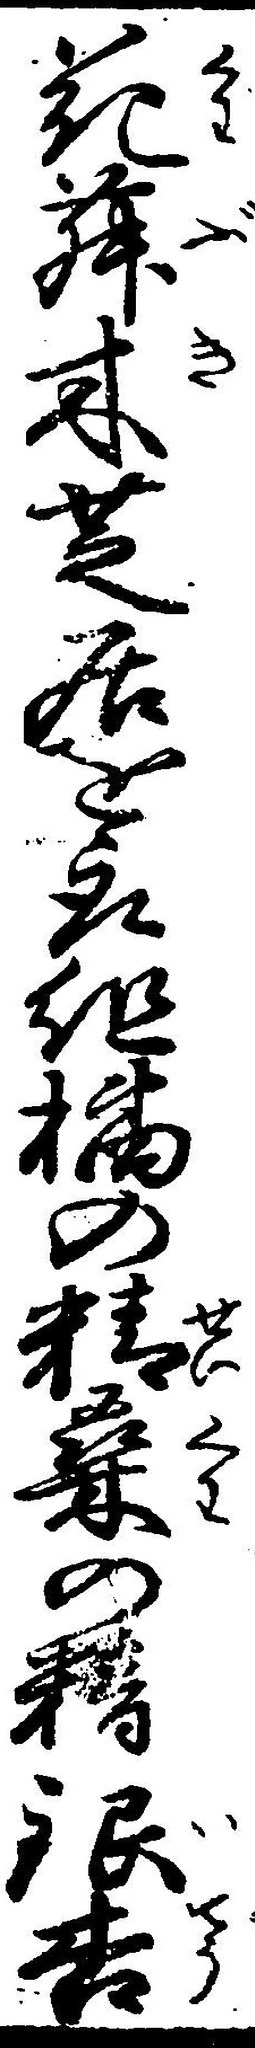花舞木芝居を取組橘の精桑の精銀杏
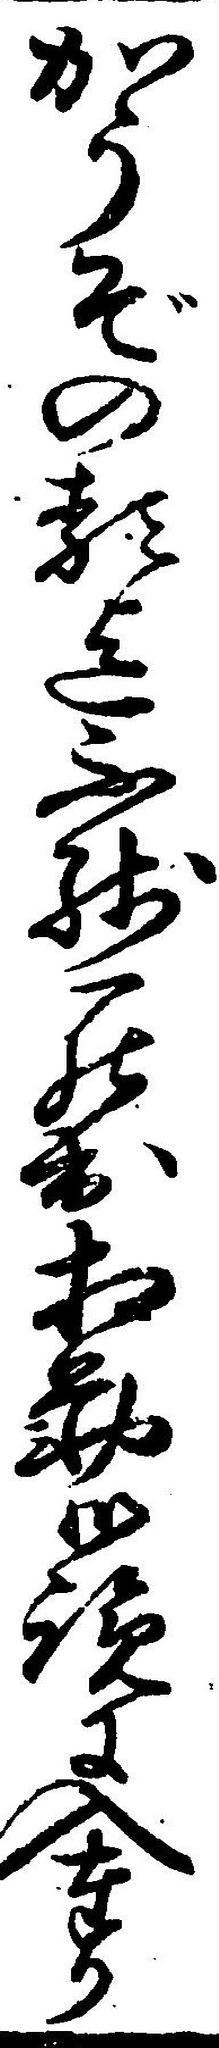かうぞの類迄不残罷出相勤御覧に入奉り
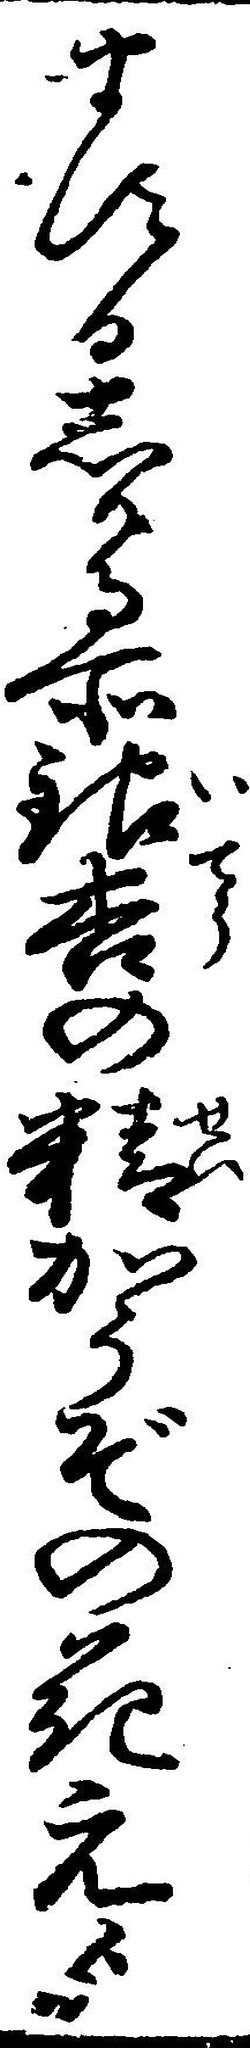まするしかる所銀杏の精かうぞの花元ゟ
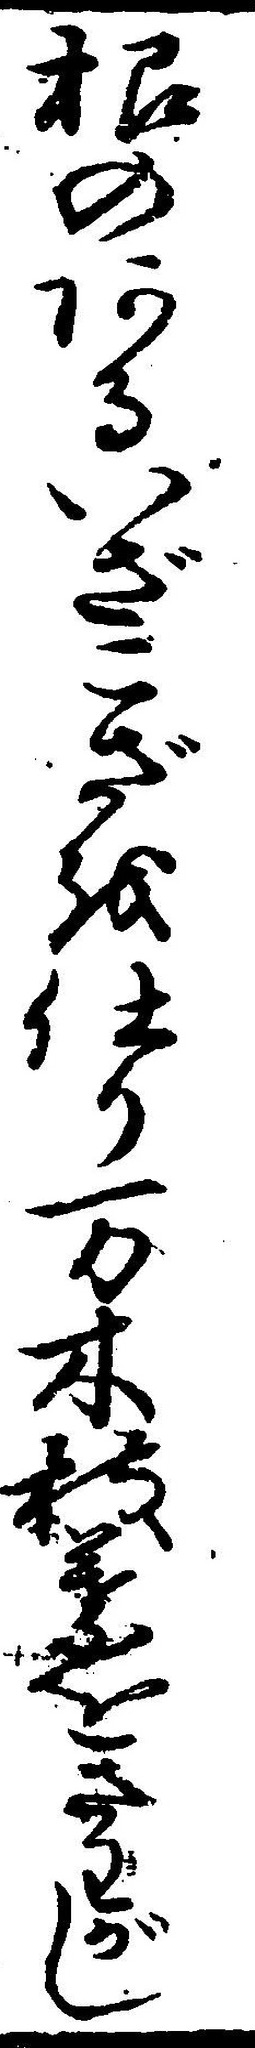根のあるいざこざを仕り万木枝葉をさわがし
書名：草木芝居化物退治 / 泉花堂三蝶(十六兵衛)作
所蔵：東京大学総合図書館 General Library in the University of Tokyo, JAPAN
